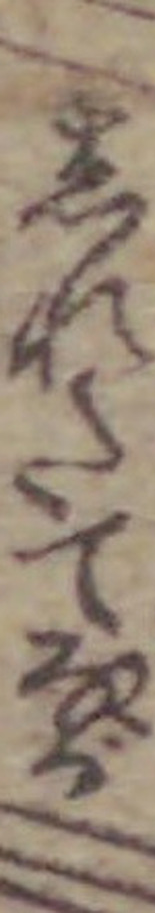しれたてなが
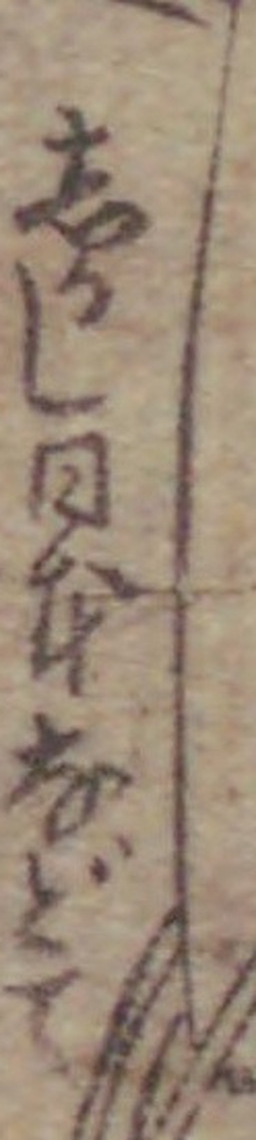しかし日本などて
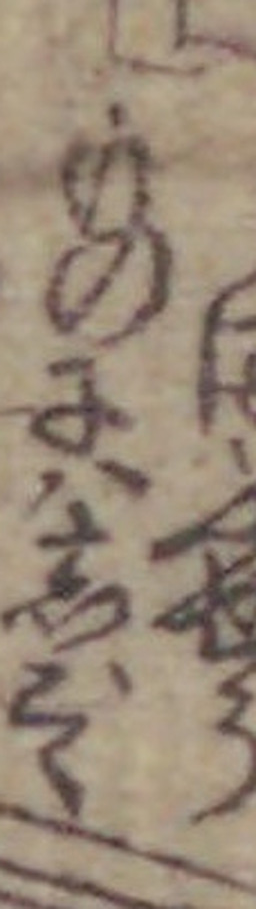ものにはしごく
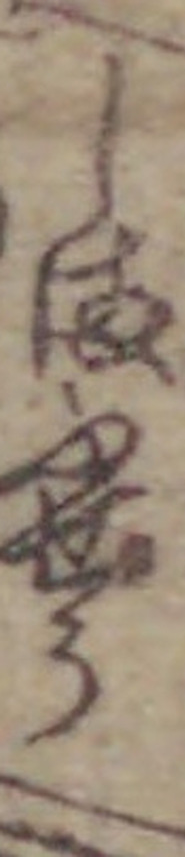しまふせう
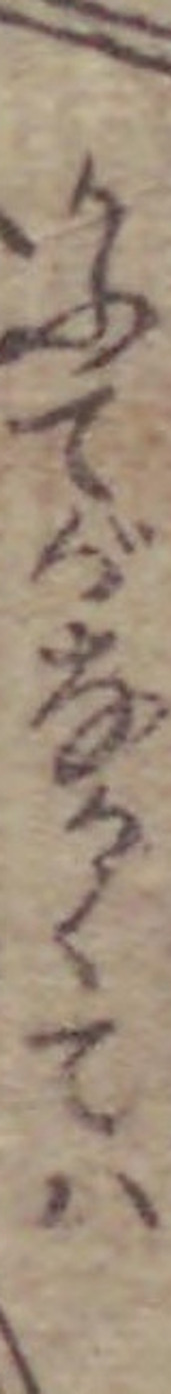かふてがなかくては
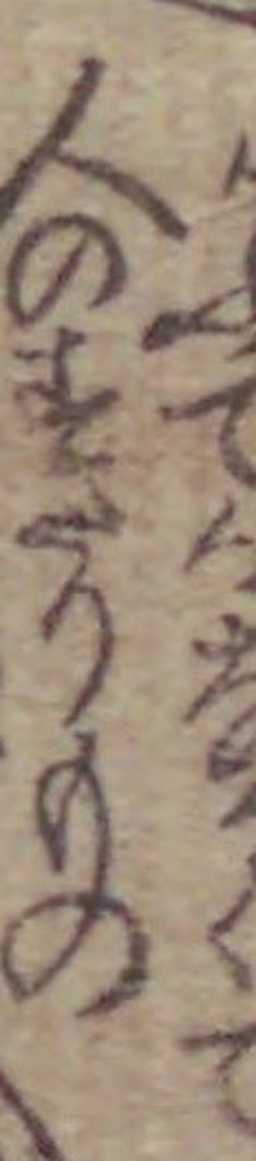人のすたりもの
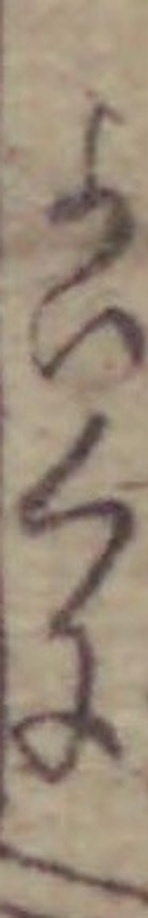よいくに
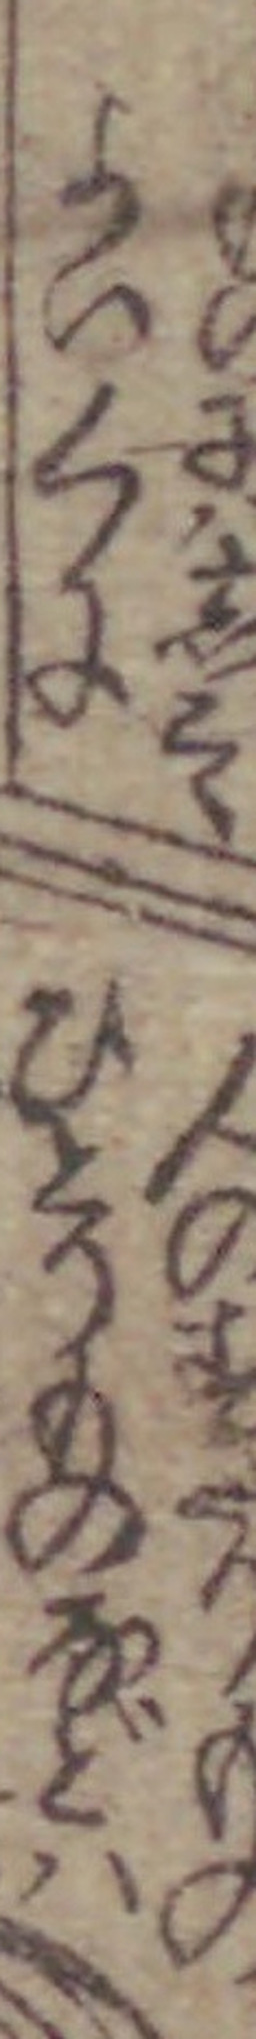よいくに
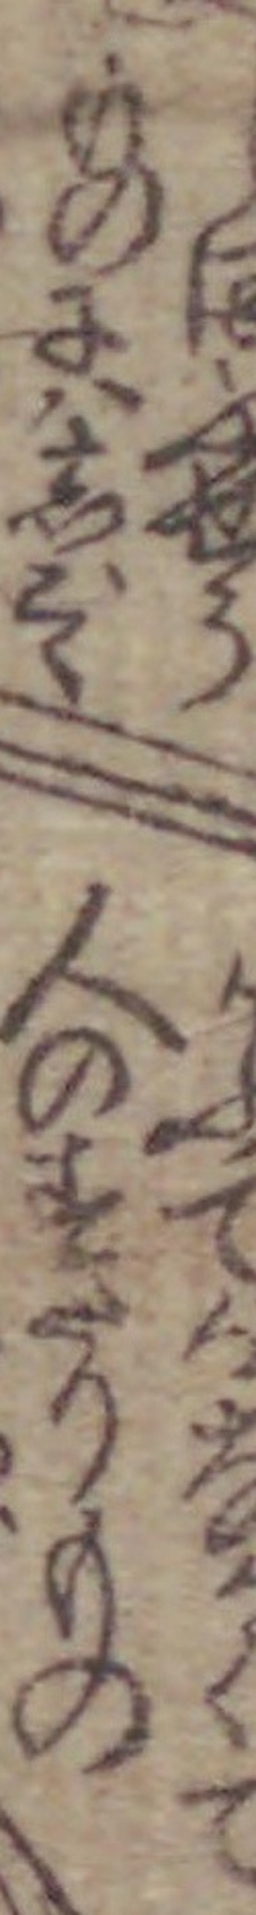ものにはしごく
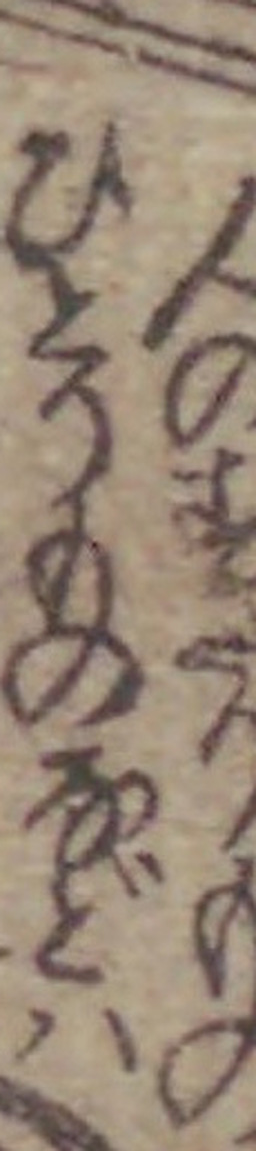ひとりものなどは
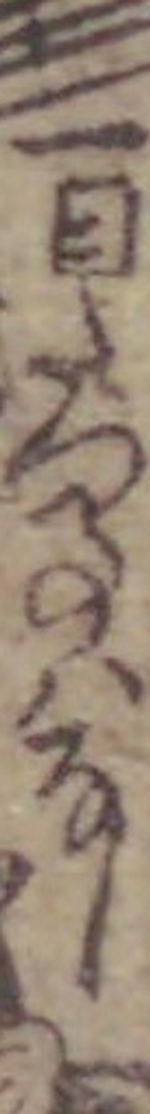一日たつ事はなし
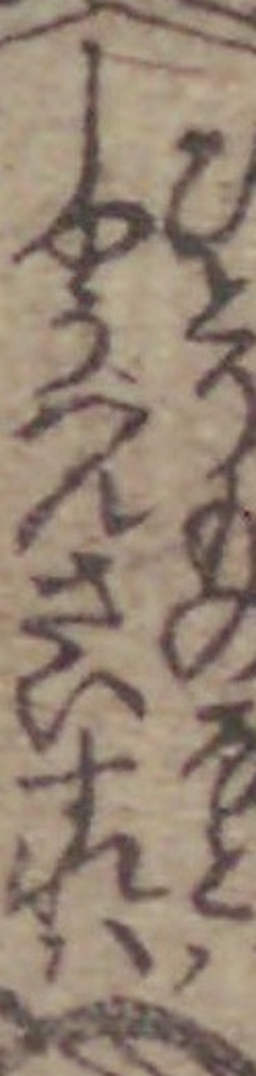しやうべんさいすれは
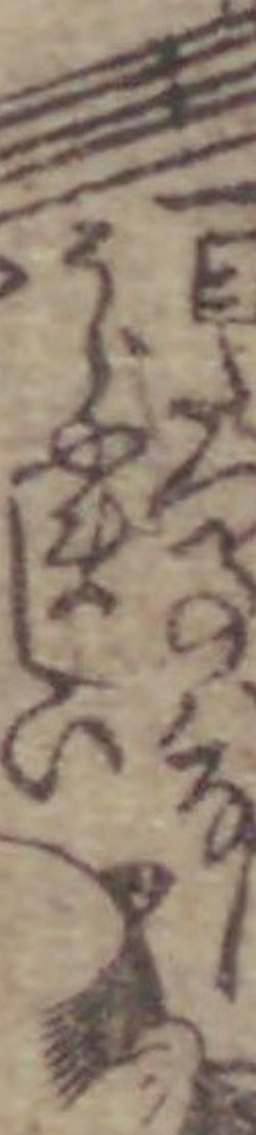うらやましい
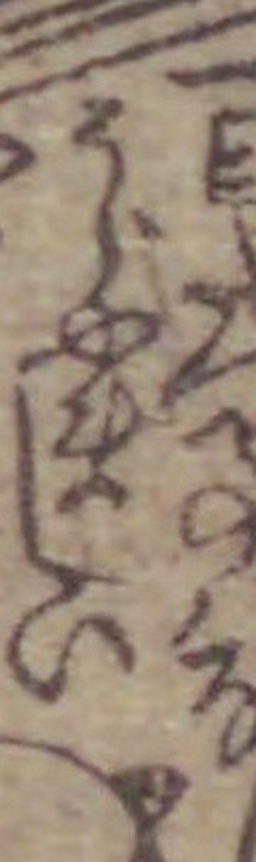うらやましい
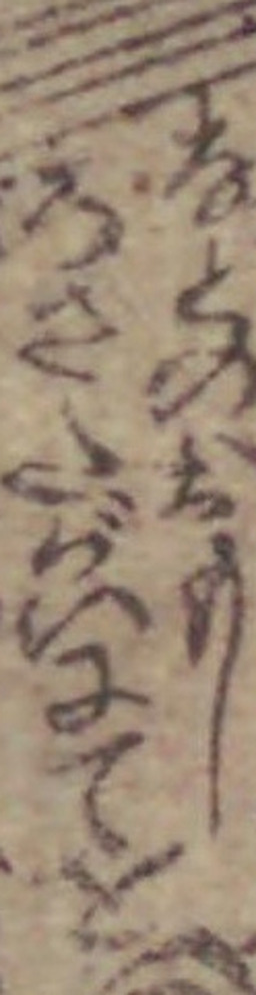ろさたがいにてを
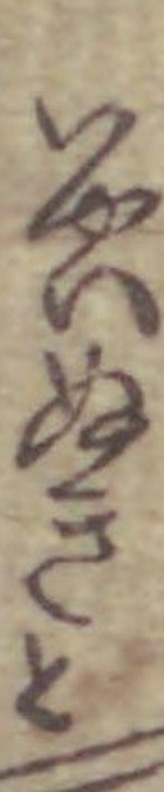いやいぬきと
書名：近頃嶋めぐり 3巻
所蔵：国立国会図書館 National Diet Library, JAPAN
